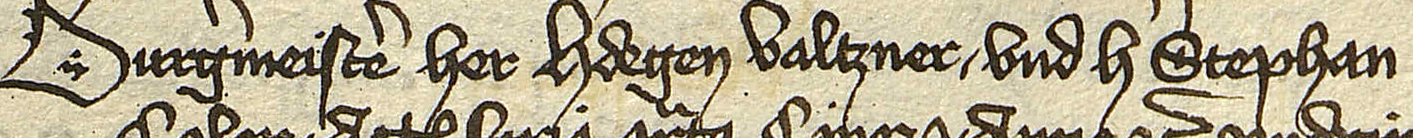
Burg*meiſte* her h*degen Valtʒner / vnd h* Stephan
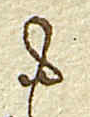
§
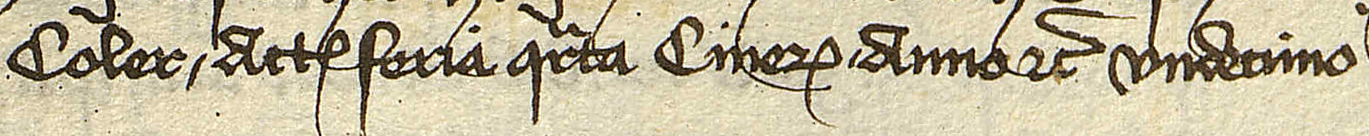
Coler / Act* feria qrta* Ciner* Anno ec* vndecimo
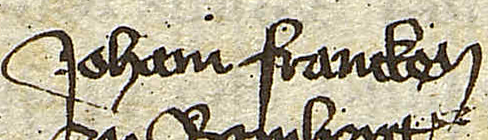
Iohani Francken
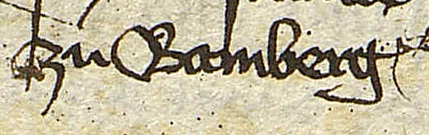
cʒu Bamberg*
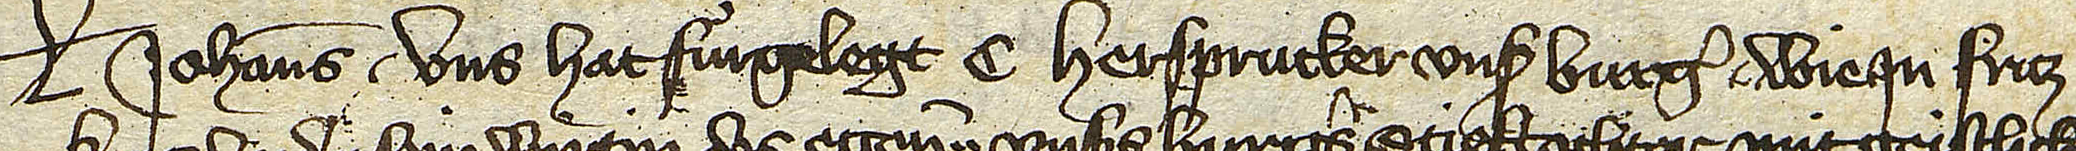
L* Iohans / Vns hat fürgelegt C herſprucker vnſ* burg* / wie In fricʒ
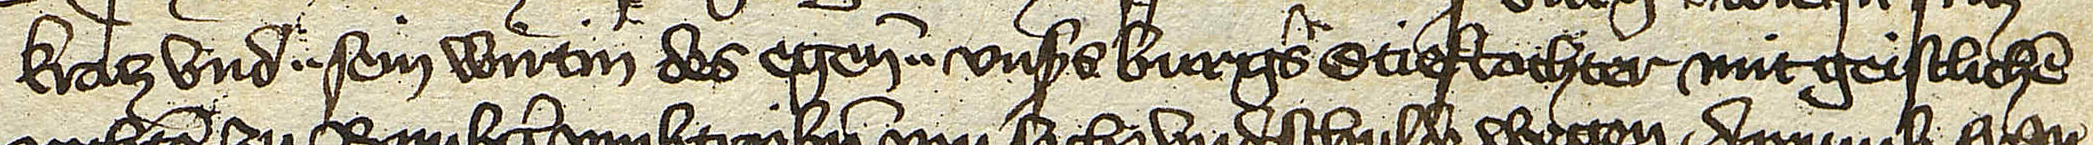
kracʒ vnd ~ ſein wirtin des egen* ~ vnſ*s burgs* Stieftochter mit geiſtliche*
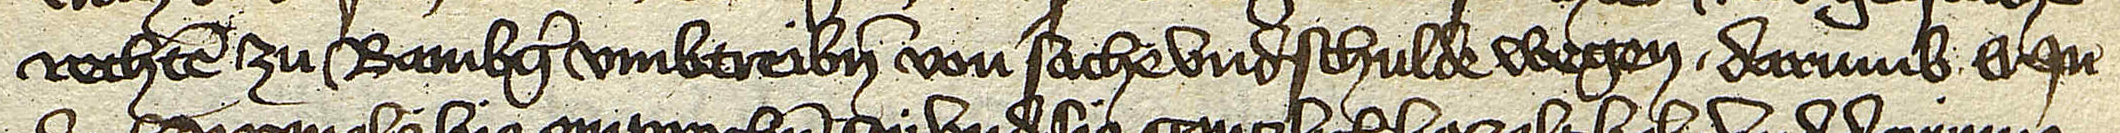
rechte* cʒu Bambg* vmbtreibn* von ſache vnd ſchulde wegen / darvmb Er In
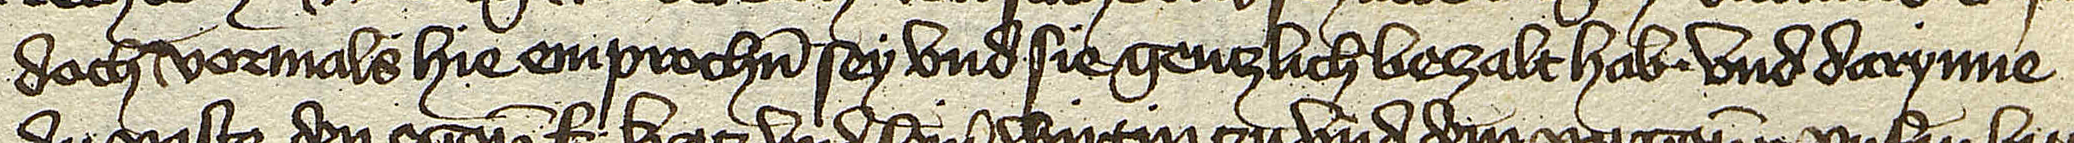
doch vormals hie einprochn* ſey vnd ſie gencʒlich becʒalt hab . Vnd darynne
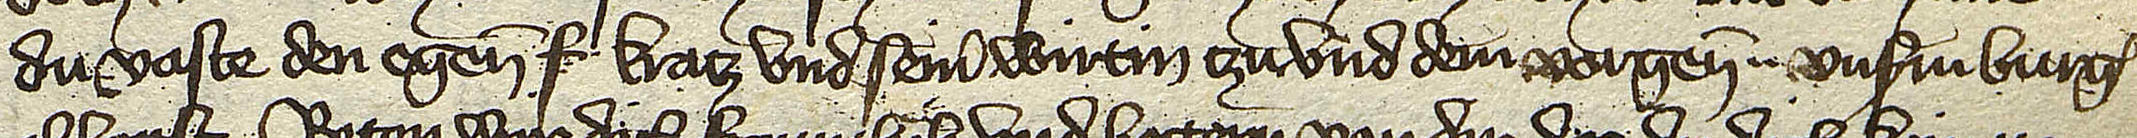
du vaſte den egen* f kracʒ vnd ſein* wirtin cʒu vnd dem vorgen* ~ vnſ*m burg*
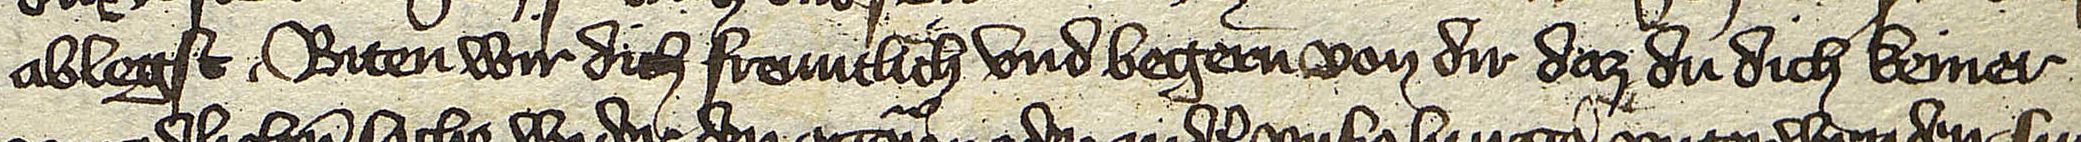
ablegſt / Biten wir dich freuntlich vnd begern von dir daʒ du dich keiner
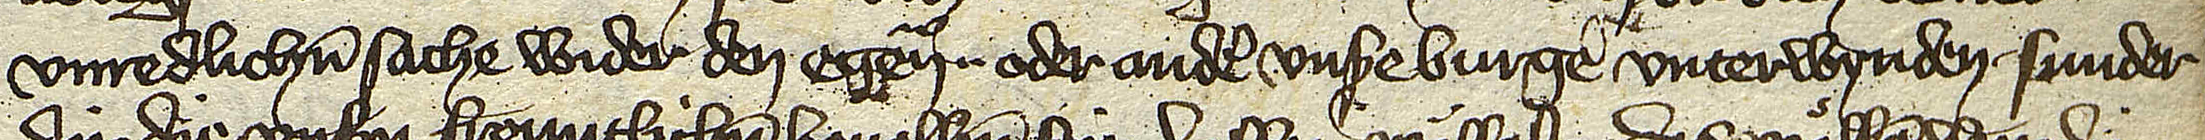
vnredlichn* ſache wider den egen* ~ oder ande* vnſ*e burge* vnterwynden / ſunder
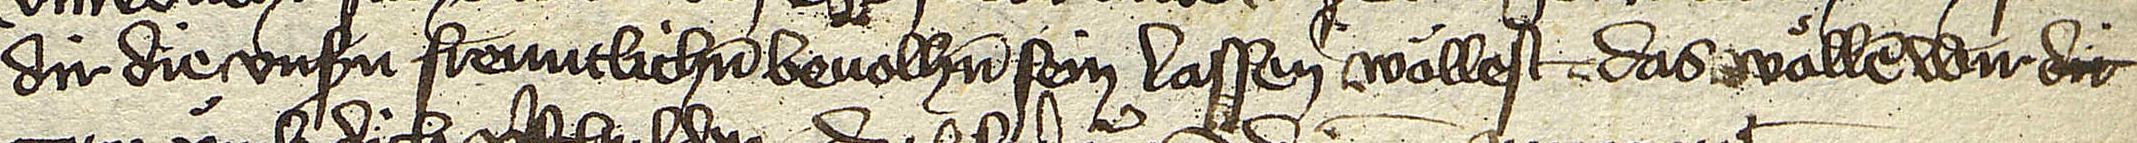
dir die vnſ*n freuntlichn* beuolhn* ſein laſſen wölleſt das wölle* wir dir
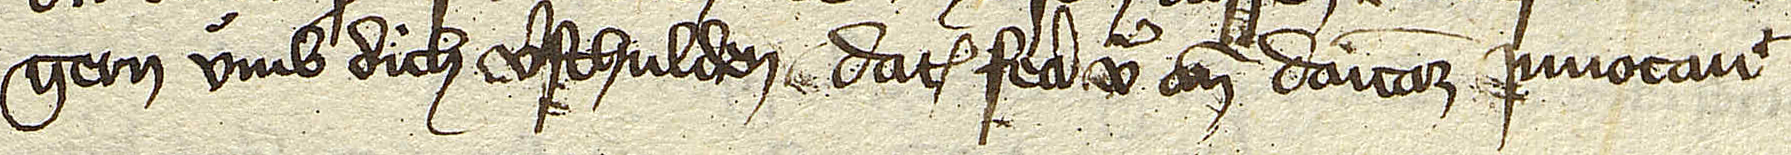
gern v̈mb dich v*ſchulden dat* fea* v* an* doi*ca* Inuocau*
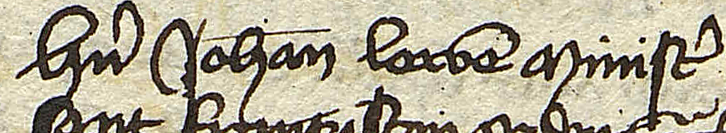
hn* Iohan lewe* Miniſt*
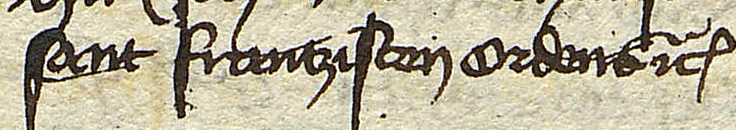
ſant frantʒiſcen Ordens ec*
